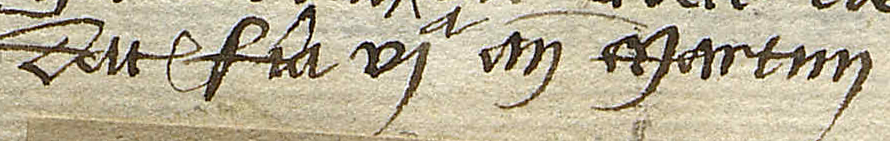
Dat* fi*a vi* an* Martini
